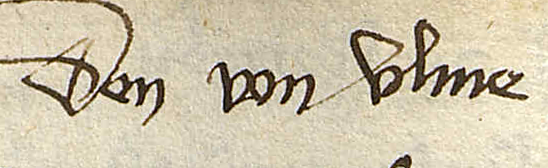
Den von Vlme
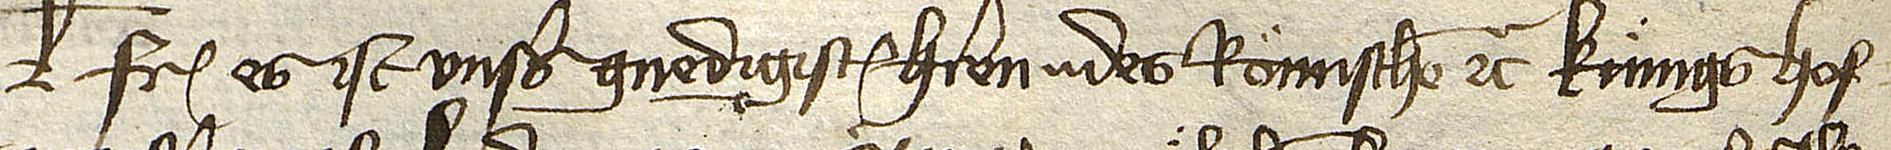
L* fr* es iſt vnſs* gnedigiſt* h*ren ~ des Römiſche* ec* künigs hof =
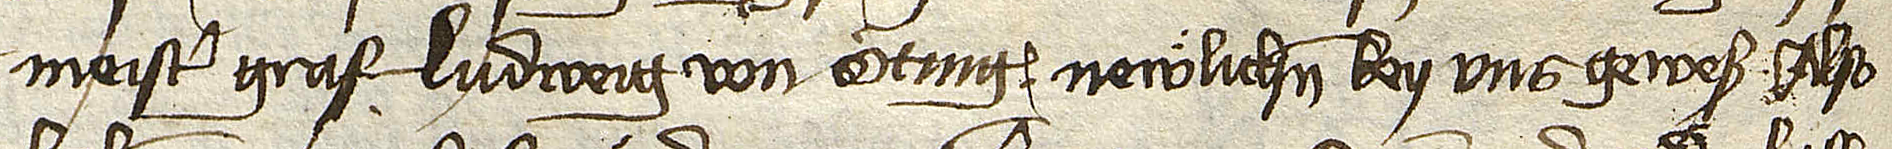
meiſt* graf ludweig von Öting* neẅlichn* bey vns geweſ* . Alſo
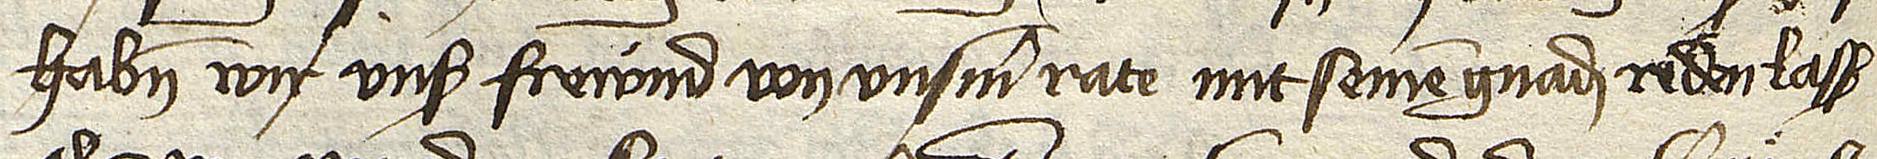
habn* wir vnſ* freẅnd von vnſm* rate mit ſeine* gnad* reden laſſ*
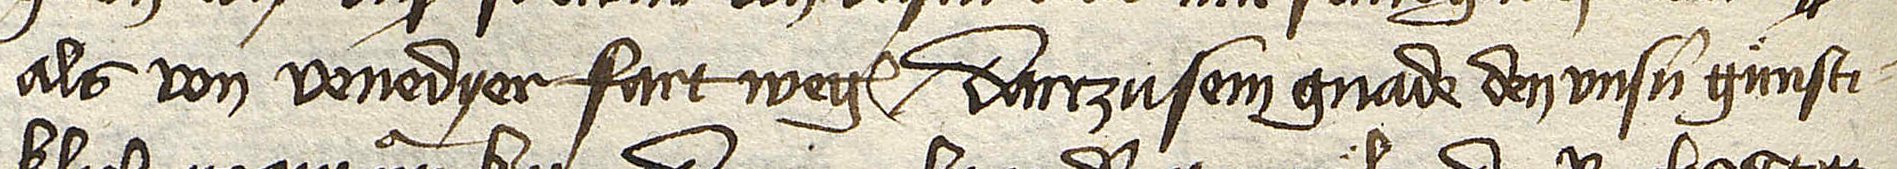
als von Venedyer fart weg* / Darcʒu ſein gnade den vnſn* günſti =
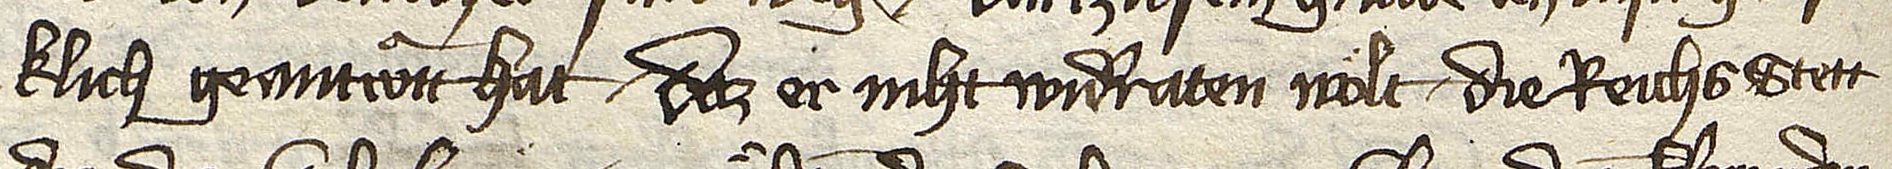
klich geantw*tt hat / Daʒ er niht wid*raten wölt / Die Reichs Stett
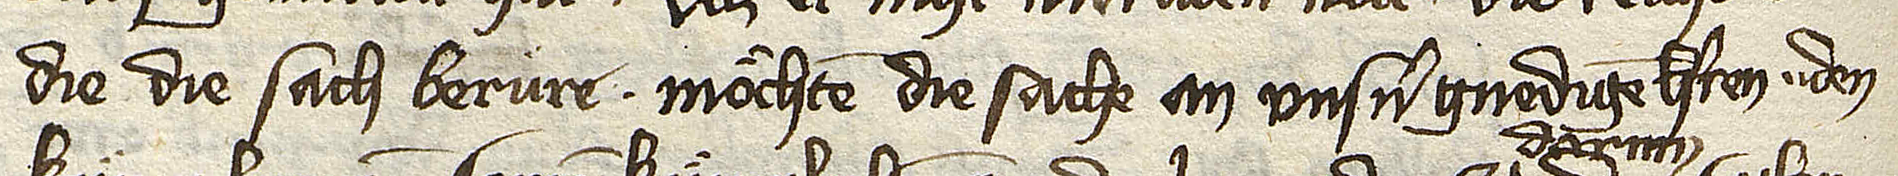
die die ſach berüre* . Möchte* die ſache an vnſn* gnedige* h*ren ~ den
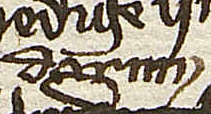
darinn
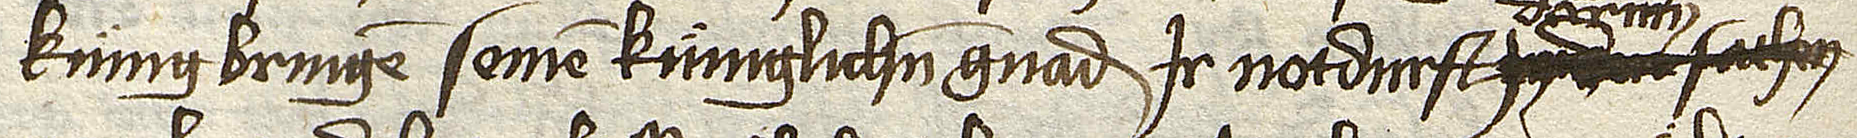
künig bringe* ſeine* küniglichn* gnad* Ir notdurft In den ſachen
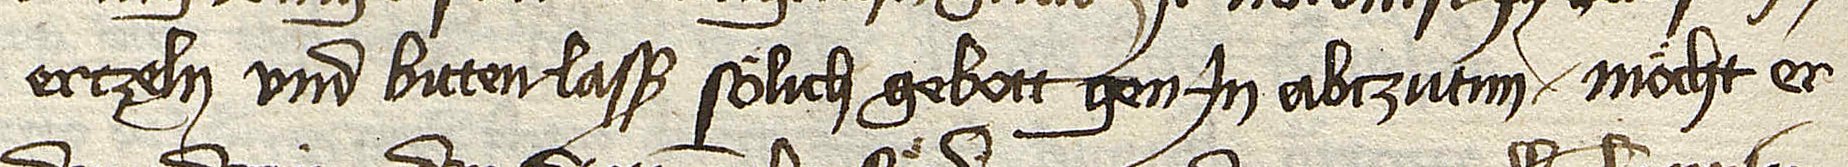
ercʒeln vnd bitten laſſ* ſölich gebott gen In abcʒutun / Möcht er
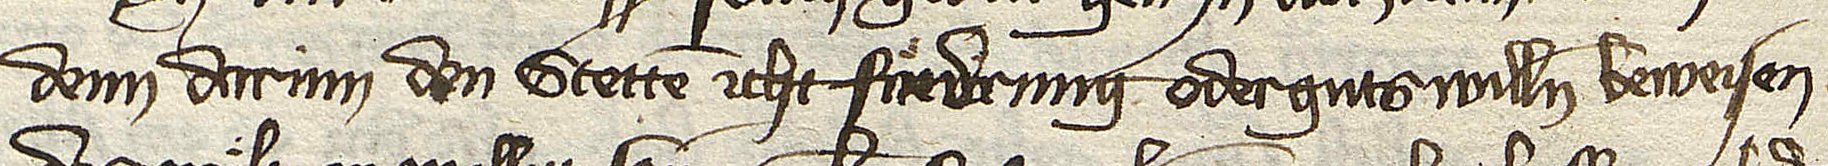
denn darinn den Stette* icht fürdrung oder guts willn* beweiſen
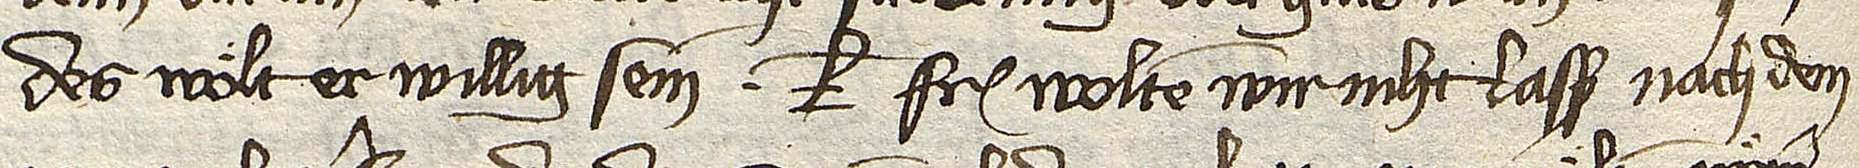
Des wölt er willig ſein . L* fr* wolte* wir niht laſſ* nach dem
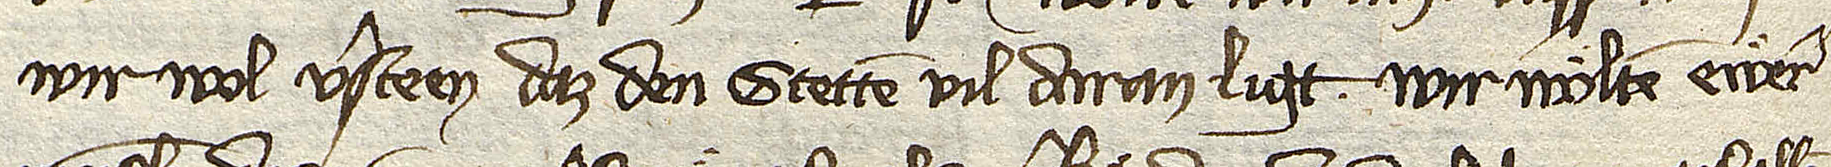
wir wol v*ſteen daʒ den Stette* vil daran ligt . wir wölte* eẅer*
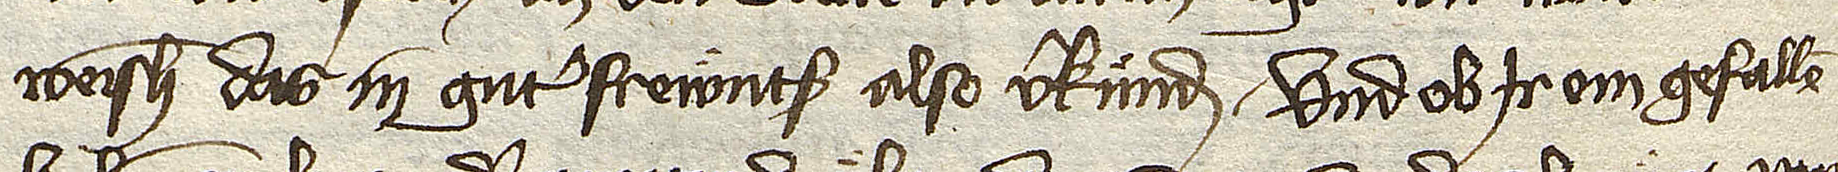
weiſh* das in gut* freẅntſ* alſo v*künd* / Vnd ob Ir ein gefalle*
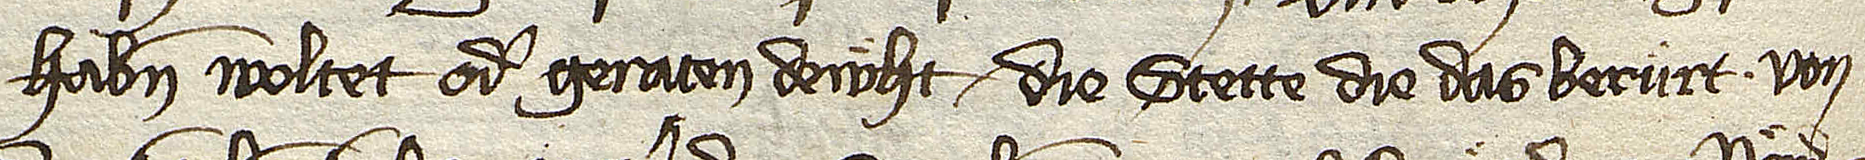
habn* woltet od* geraten deẅht / die Stette die das berürt . von
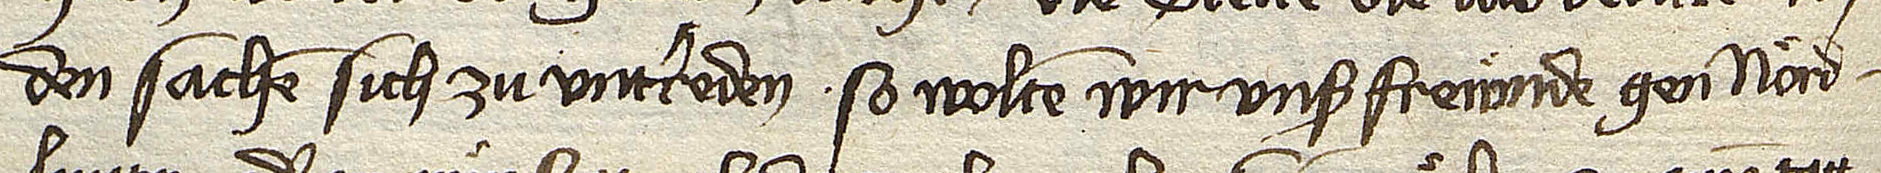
den ſache* ſich ʒu vnt*reden . ſo wolte* wir vnſ* freẅnde gen Nörd -
